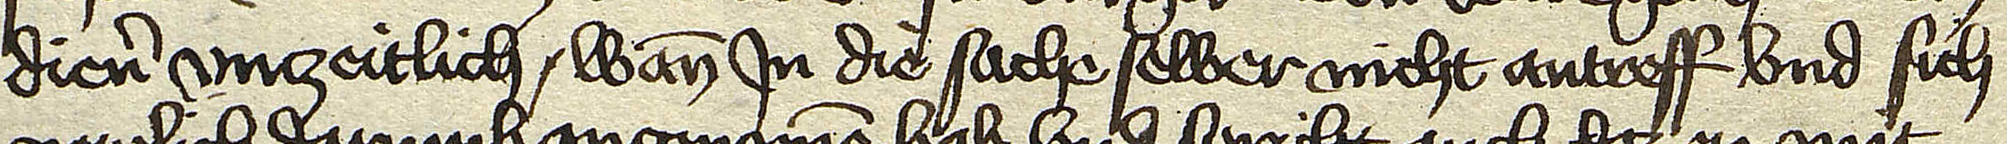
dien* vncʒeitlich / wan* In die ſache ſelber nicht antreff vnd ſich
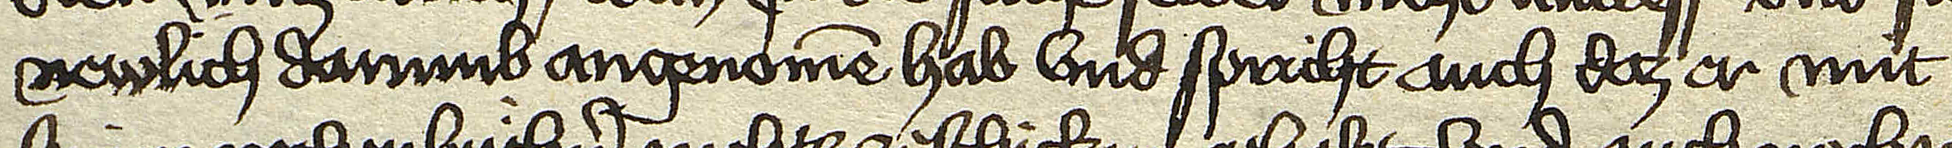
newlich darumb angenome* hab vnd ſpricht auch daʒ er mit
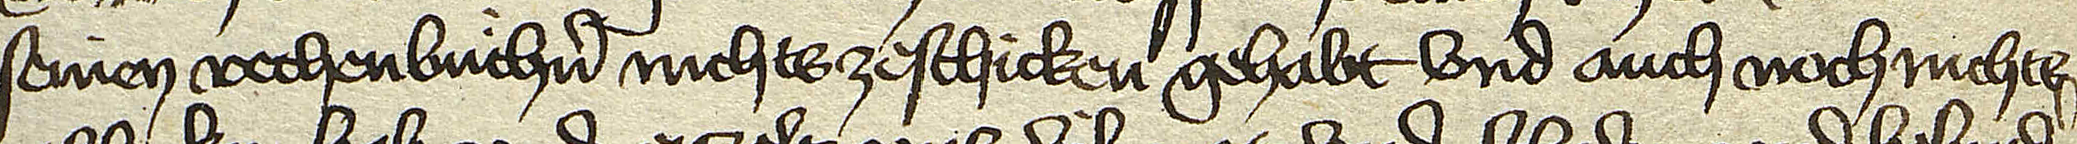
ſeinen rechenbüchn* nichts cʒeſicken gehabt vnd auch noch nichts
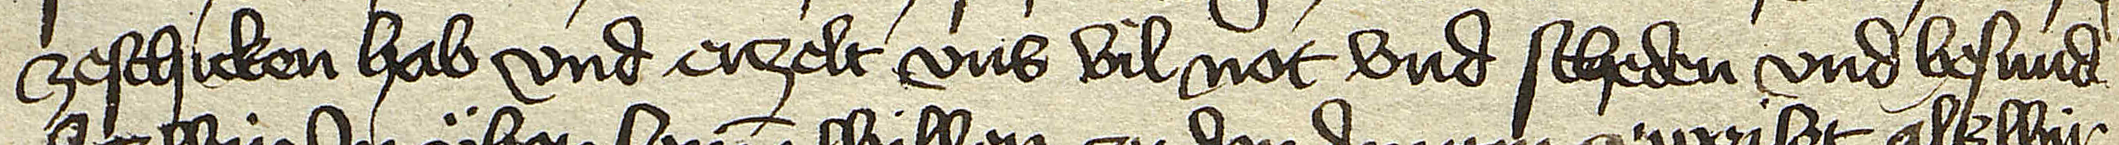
cʒeſchicken hab vnd ercʒelt vns vil not vnd ſcheden vnd beſund*
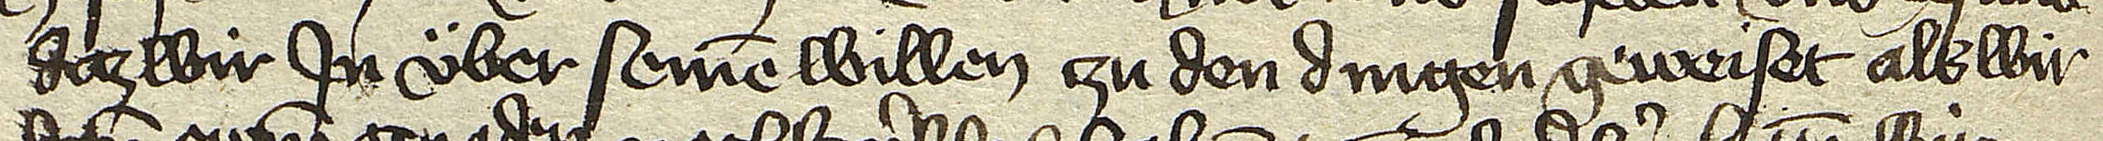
daʒ wir In v̈ber ſeine* willen cʒu den dingen geweiſet als wir
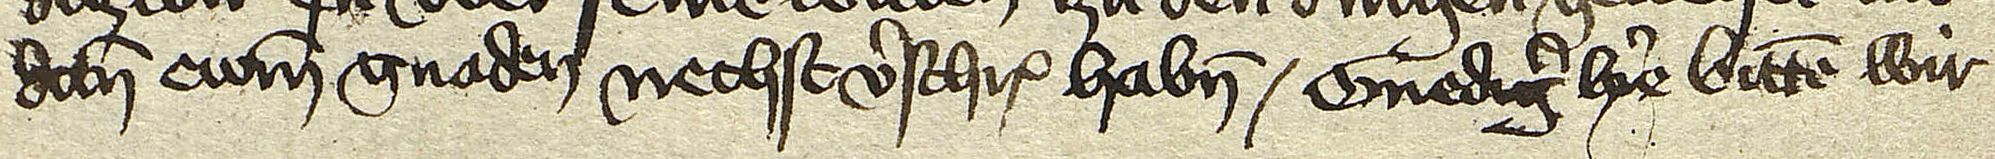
dan* ewrn* gnaden nechſt v*ſchr* habn* / Gnedig* h*re bitte* wir
